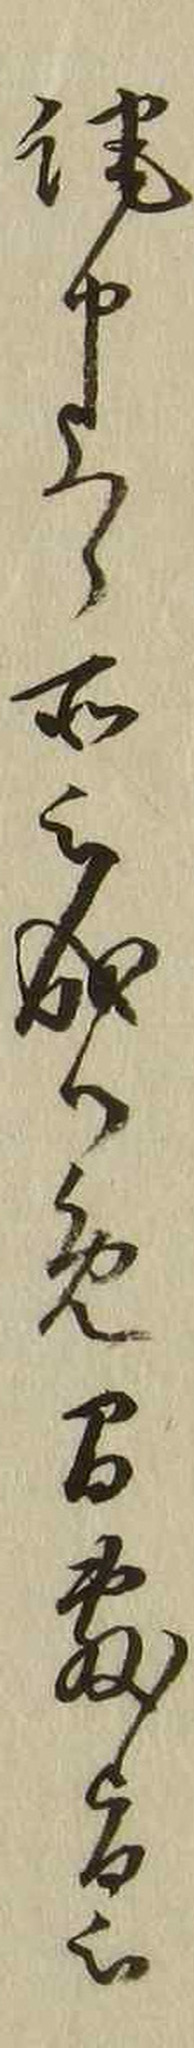詫申上候所被成御免間敷旨被
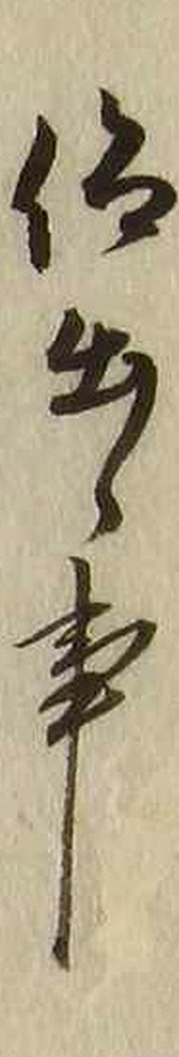仰出候事
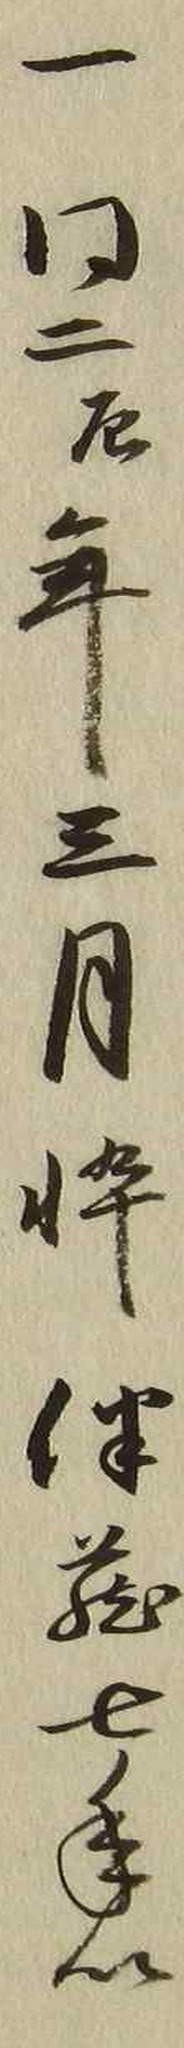一同二辰年三月忰伴蔵七年以
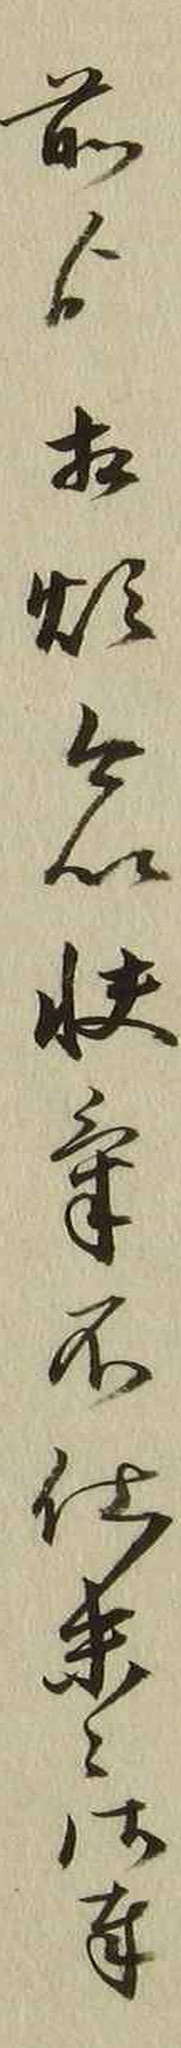前ゟ相煩今以快気不仕末々御奉
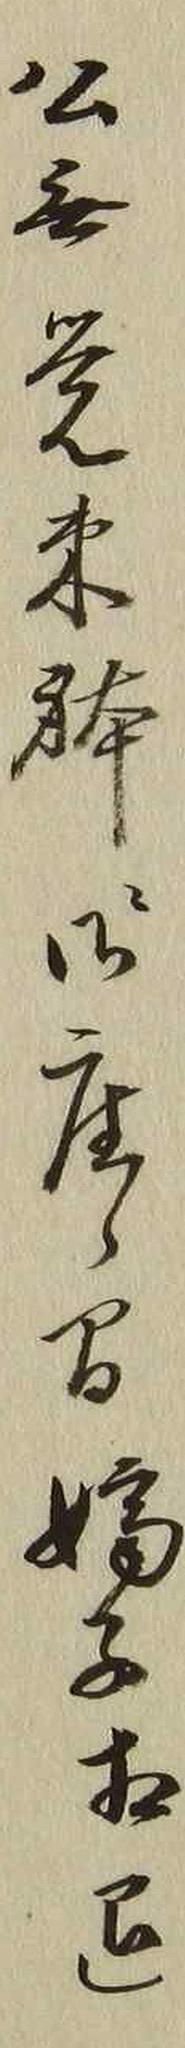公無覚束体ニ御座候間嫡子相退
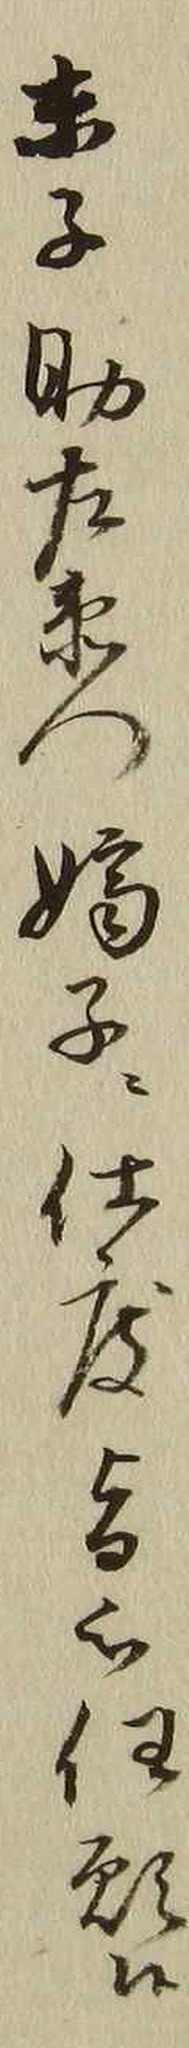末子助左衛門嫡子ニ仕度旨被任願候
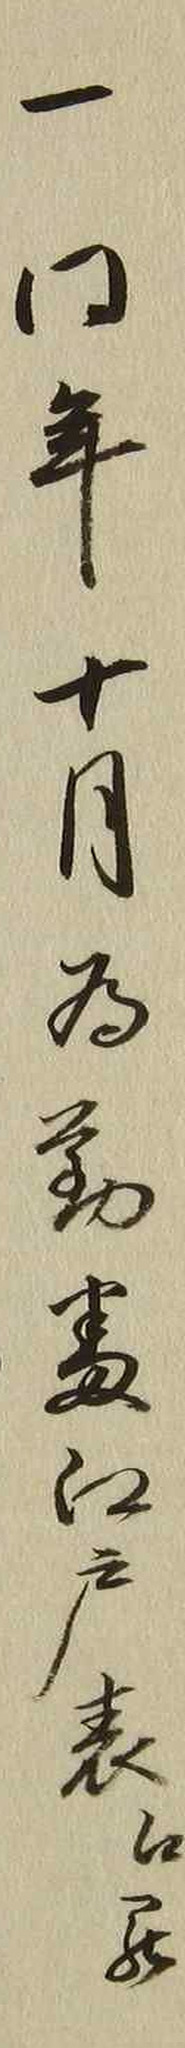一同年十月為勤番江戸表江罷
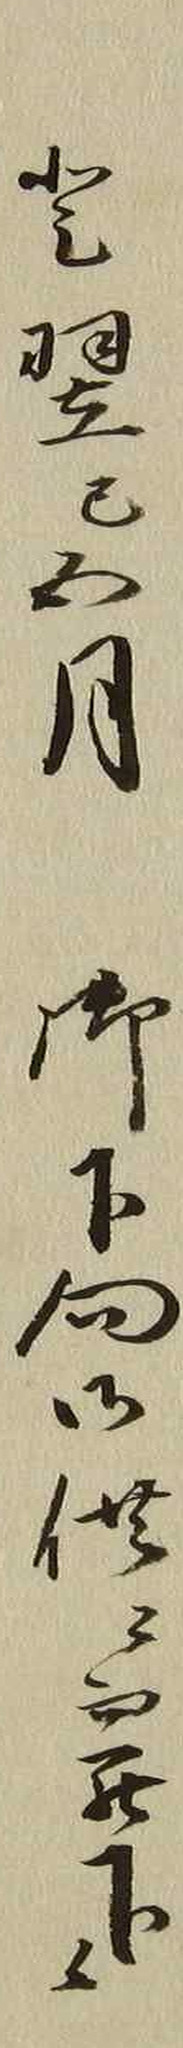登翌巳五月御下向御供ニ而罷下候
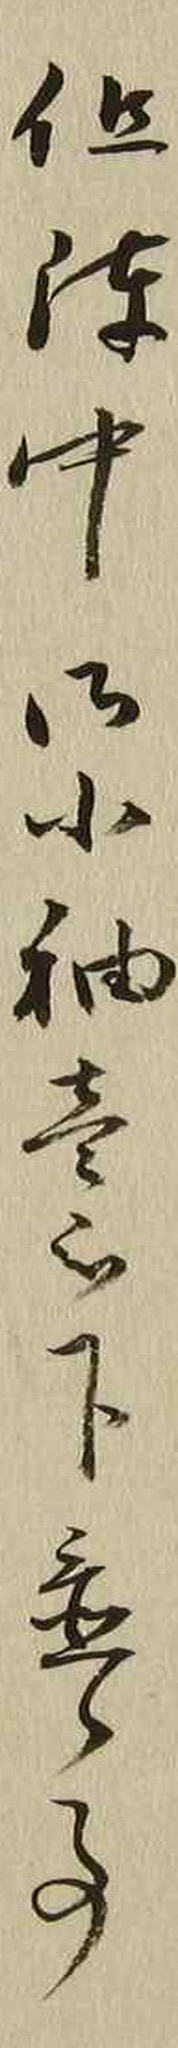但陣中御小袖壱被下置候事
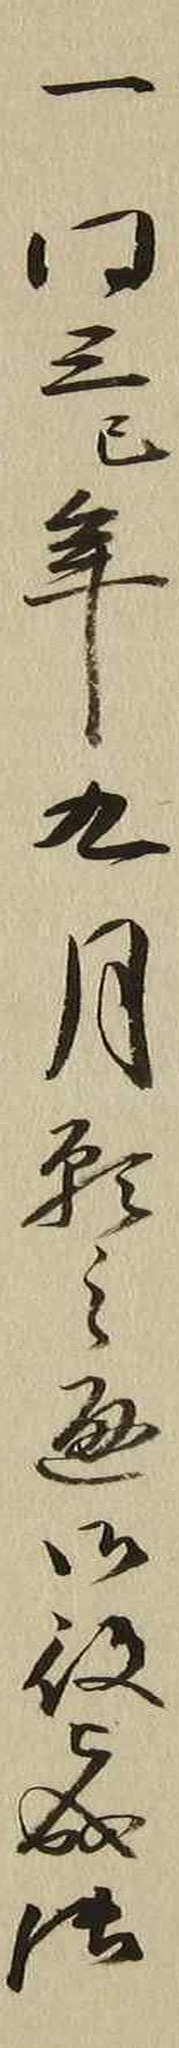一同三巳年九月願之通御役被成御
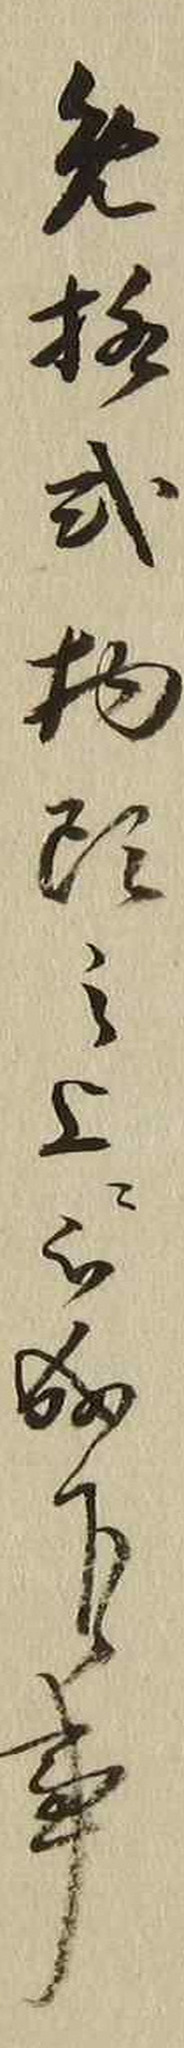免格式物頭之上ニ被成下候事
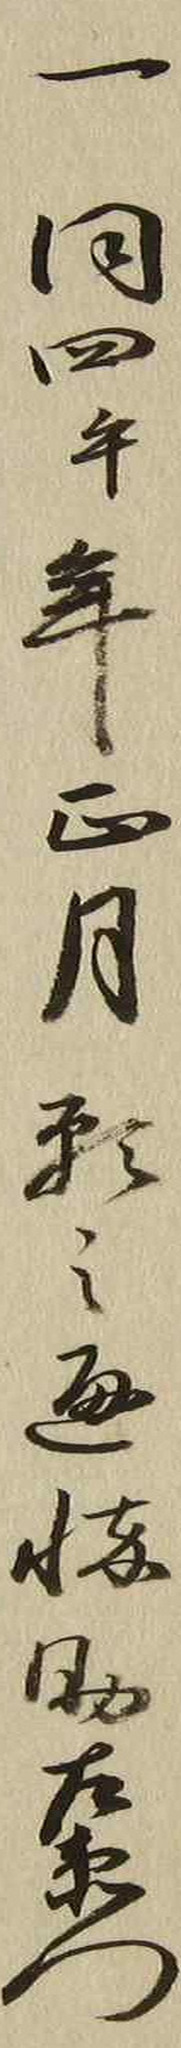一同四午年正月願之通忰助左衛門
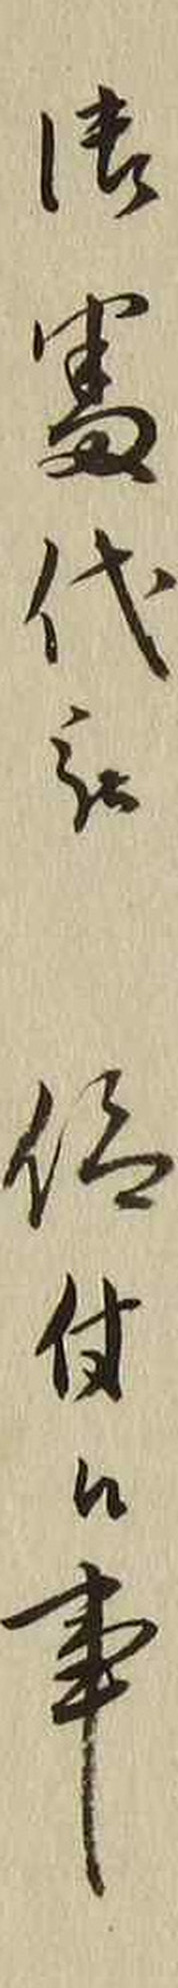御番代被仰付候事
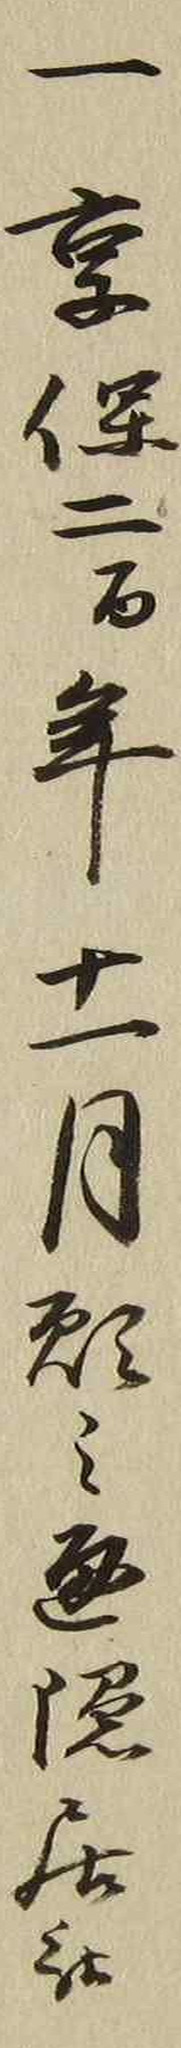一享保二酉年十一月願之通隠居被
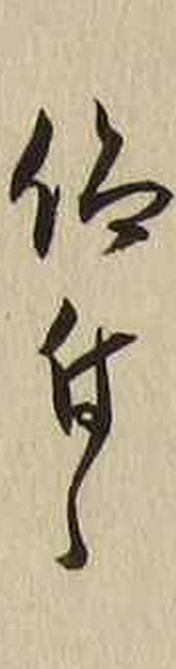仰付候
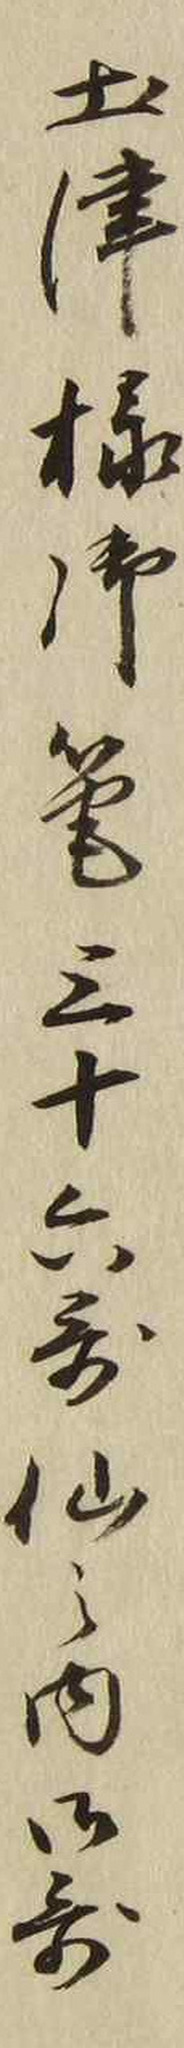土津様御筆三十六歌仙之内御歌
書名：諸士系譜　巻之69　を之部3
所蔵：会津若松市立会津図書館
